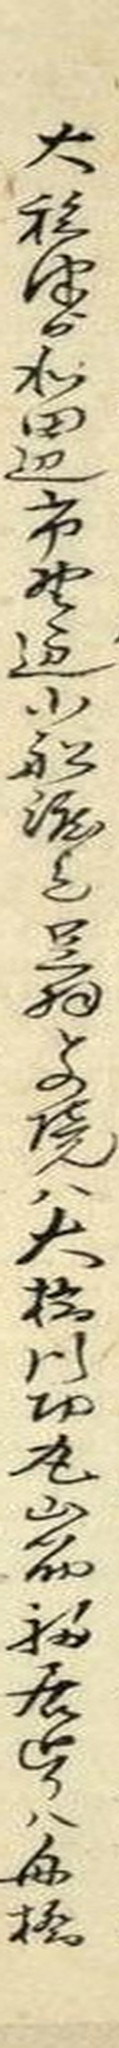大稲津ゟ和田辺市野々辺小船渡迄足羽との境ハ大橋川切丸山筋福居廻りハ船橋
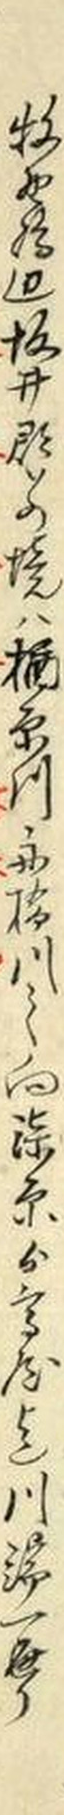牧野嶋辺坂井郡との境ハ楢原川舟橋川の向漆原ゟ高屋迄川端一通り
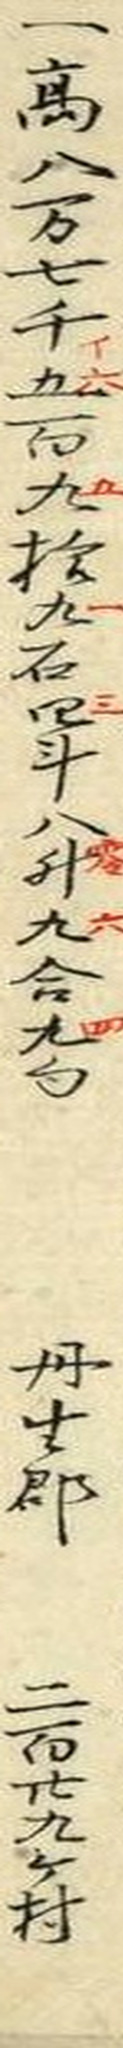一高八万七千五百九拾九石四斗八升九合九勺丹生郡二百廿九ケ村
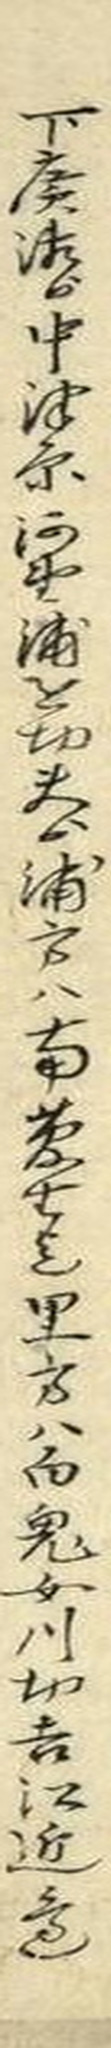下広瀬ゟ中津原河野浦を切夫ゟ浦方ハ南菅生迄里方ハ白鬼女川切吉江近辺
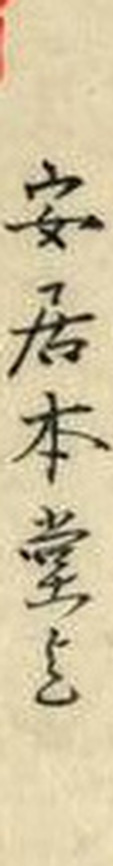安居本堂迄

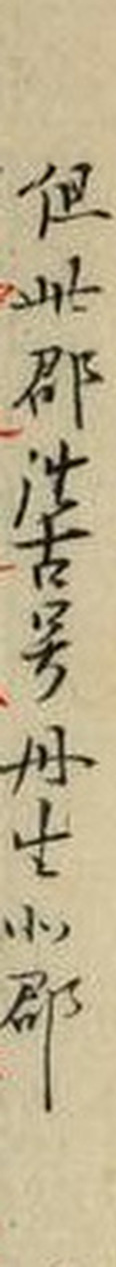但此郡往古号丹生北郡
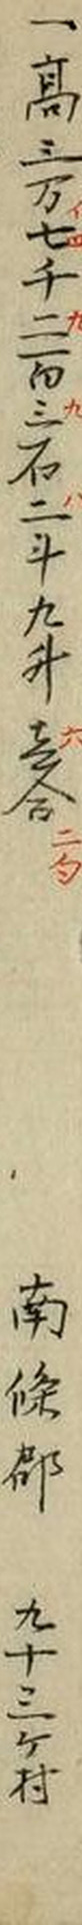一高三万七千二百三石二斗九升壱合南條郡九十三ケ村
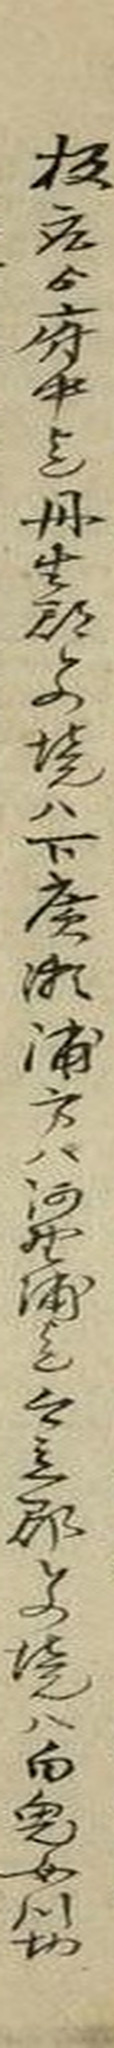板取ゟ府中迄丹生郡との境ハ下広瀬浦方ハ河野浦迄今立郡との境ハ白鬼女川切
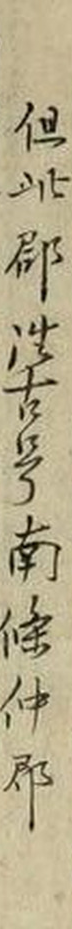但此郡往古号南條仲郡
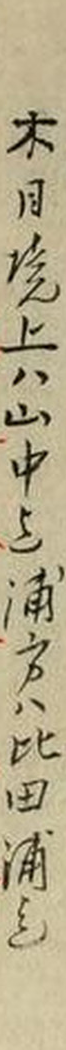木目境上ハ山中迄浦方ハ比田浦迄
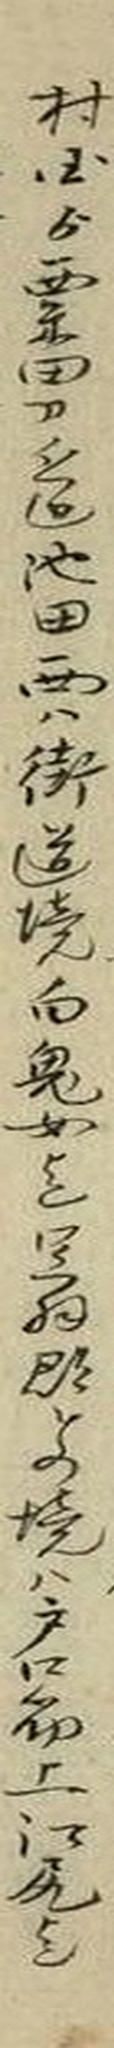村国ゟ粟田部近辺池田西ハ街道境白鬼女迄足羽郡との境ハ戸口筋上江尻迄
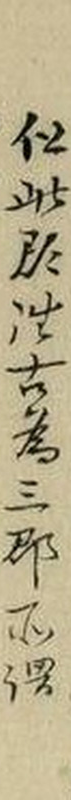但此郡往古為三郡所謂
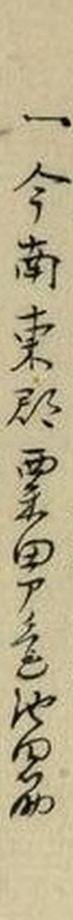一今南東郡粟田部辺池田筋
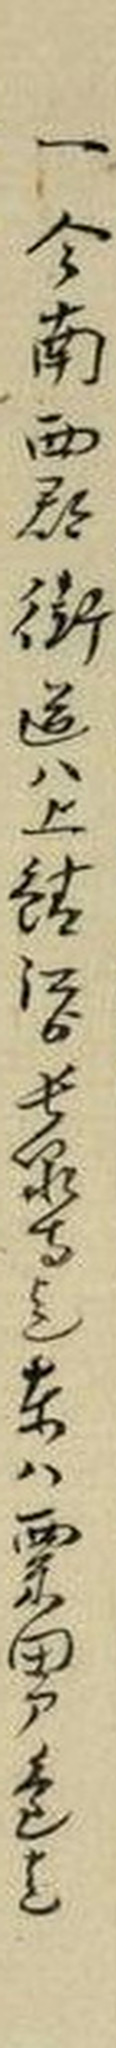一今南西郡街道ハ上鯖江ゟ長泉寺迄東ハ粟田部辺迄
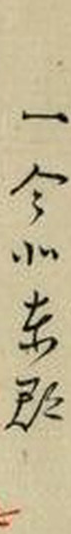一今北東郡
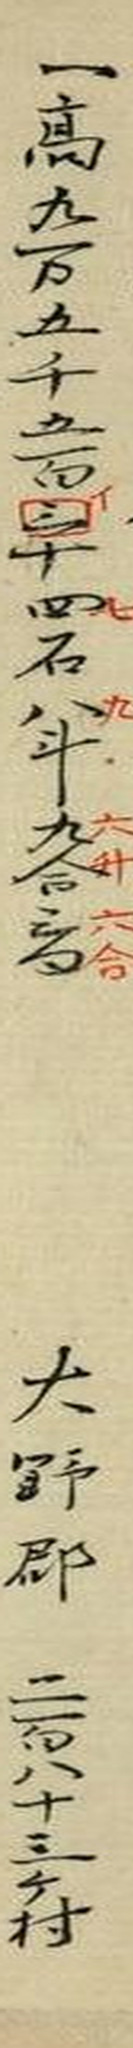一高九万五千五百三十四石八斗九合三勺大野郡二百八十三ケ村
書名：御国他国諸事之部
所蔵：福井県文書館 Fukui Prefectural Archives
